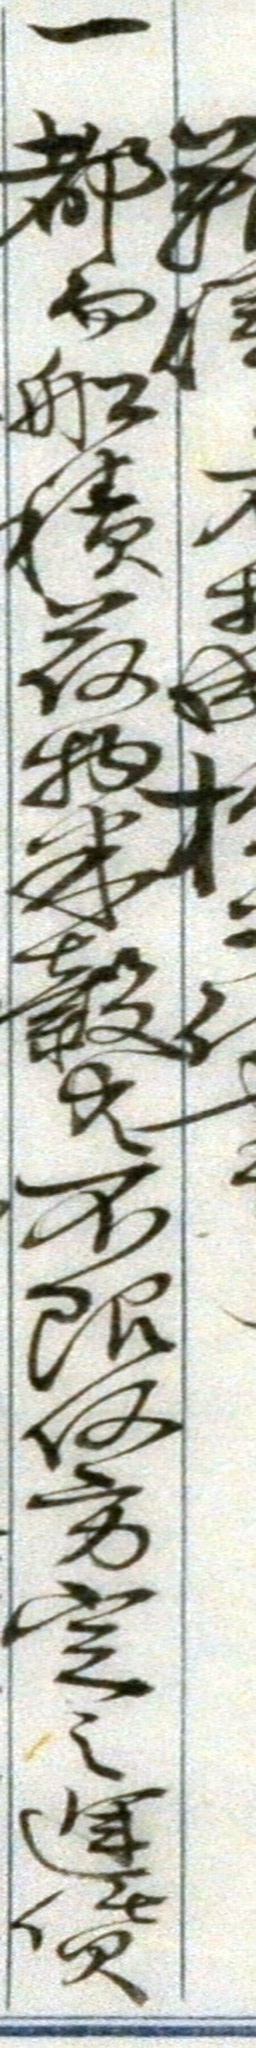一都而舩積荷物米穀共不限何方定之運賃
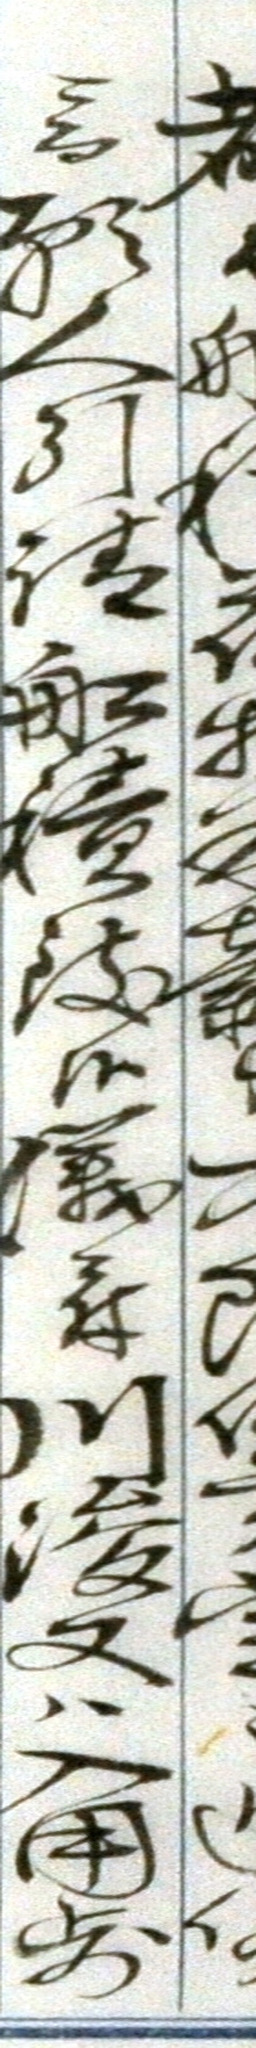ニ而願人引請船積致候儀ニ付川浚又ハ入用歩
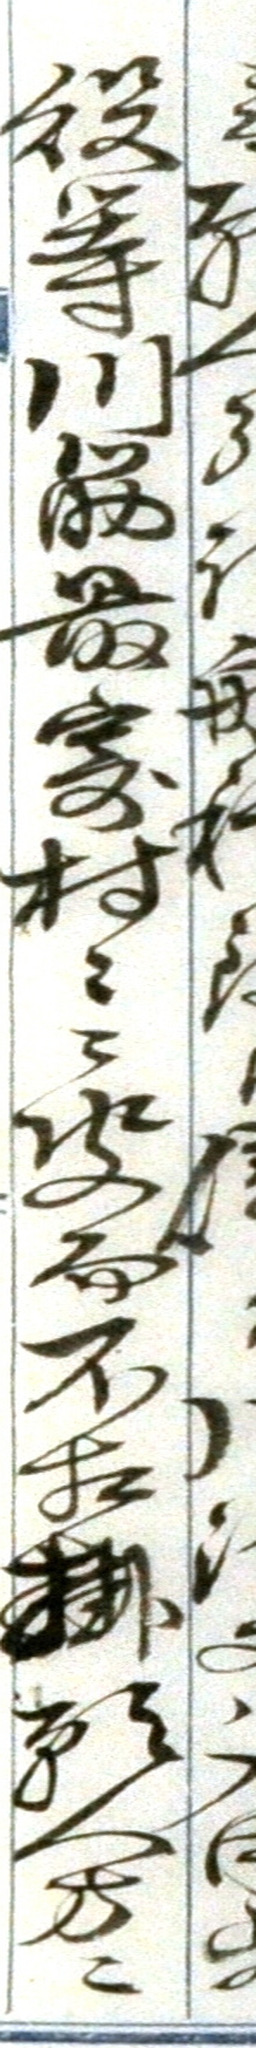役等川筋最寄村々ニ決而不相掛願人方ニ

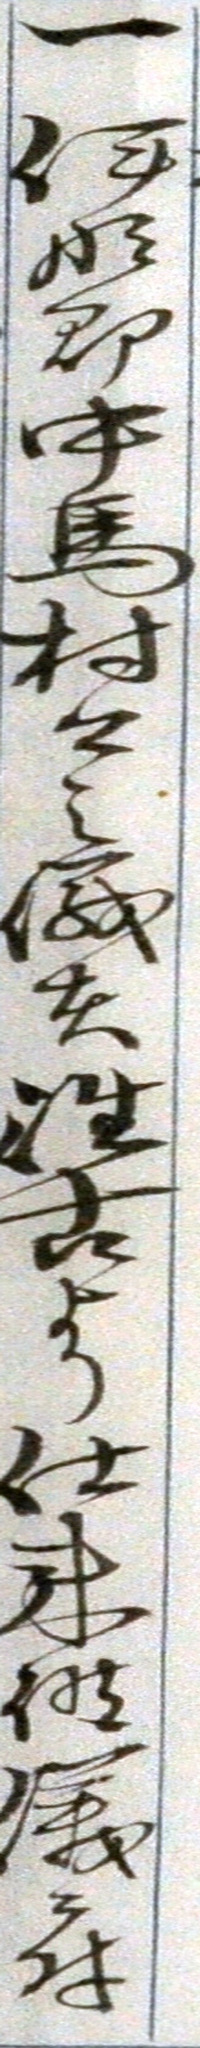一伊那郡中馬村々之儀者往古より仕来候儀ニ付
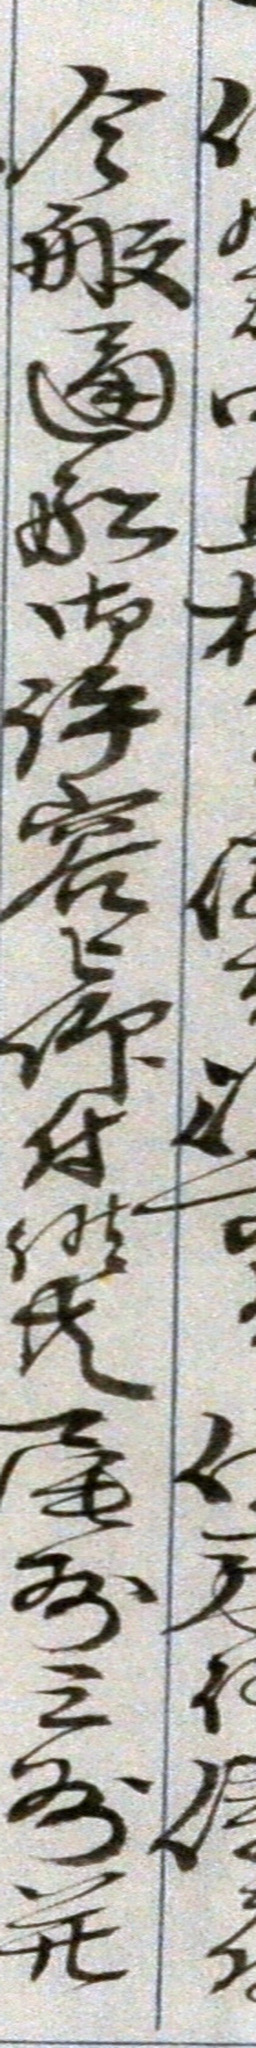今般通船御許容被仰付候共尾州三州并
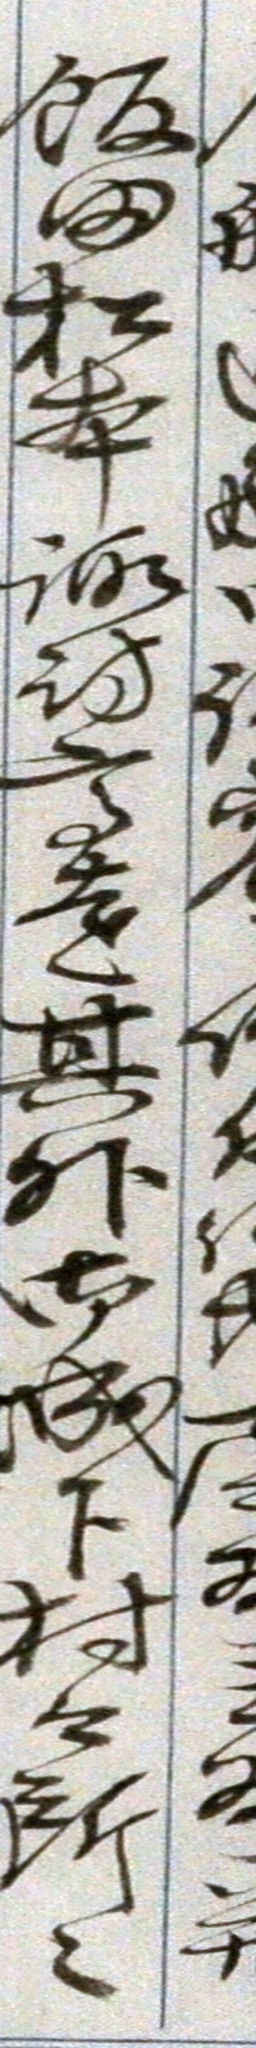飯田松本諏訪高遠其外御城下村々所々
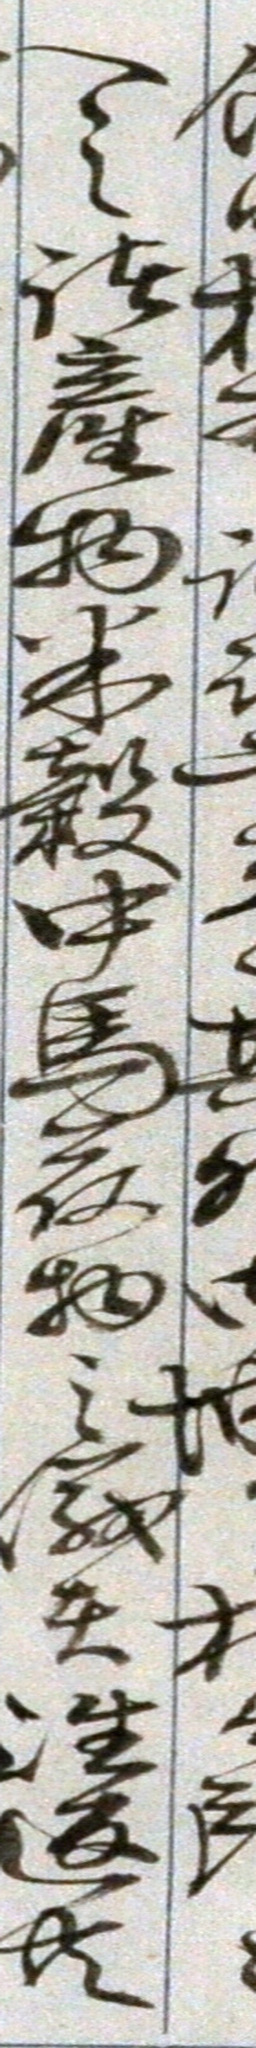へ之緒産物米穀中馬荷物之儀者往返共
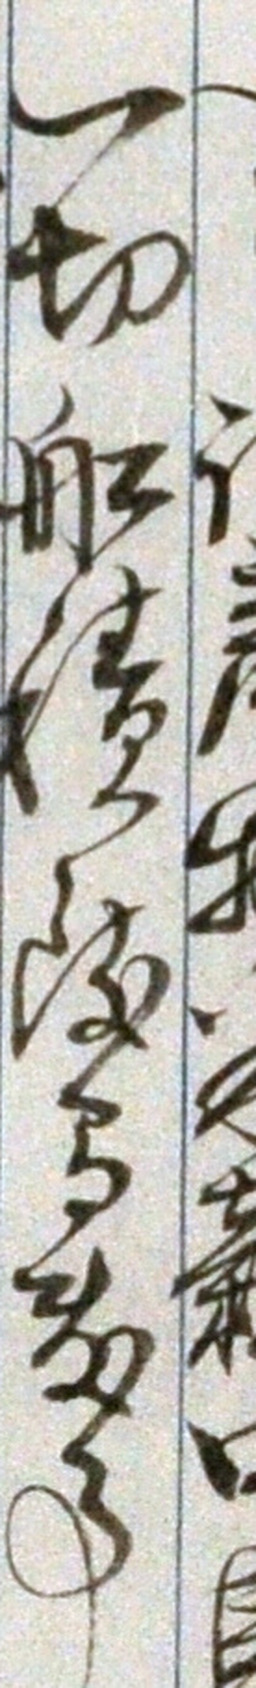一切船積致間敷事
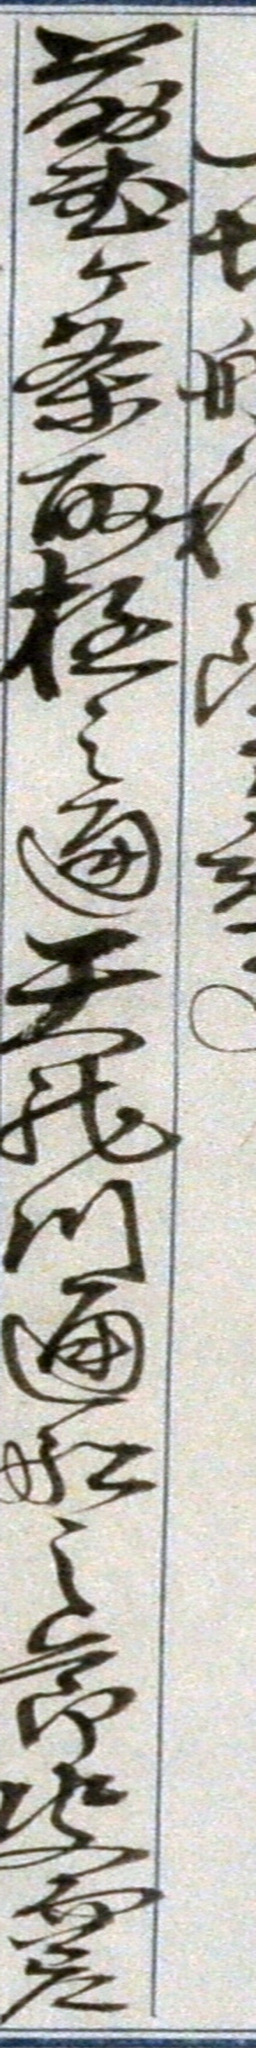前置ヶ条取極之通天龍川通船之節決而差
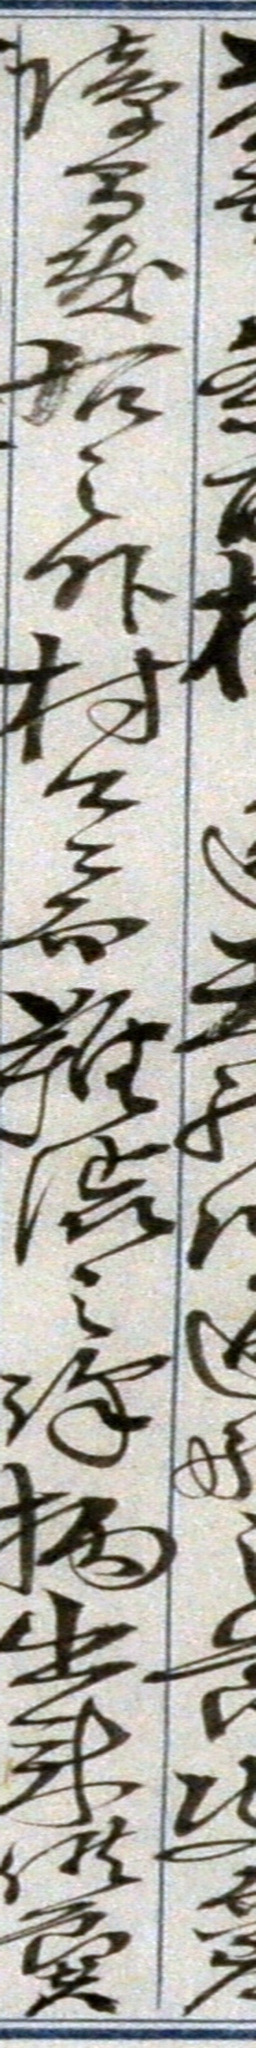障間敷右之外村々ニ而難儀の訳柄出来候節者
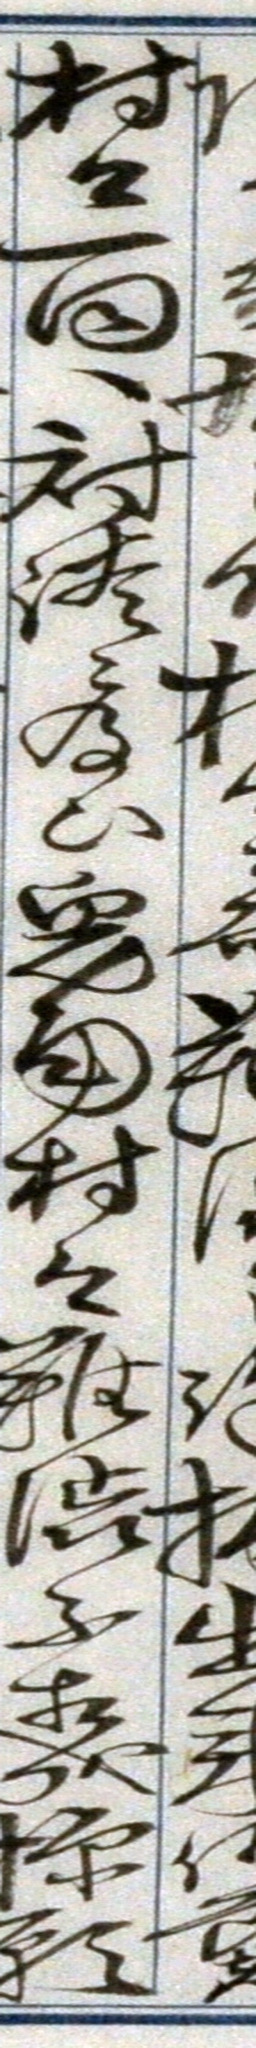村々一同へ対話ニ及ひ兎角村々難渋不相成様願
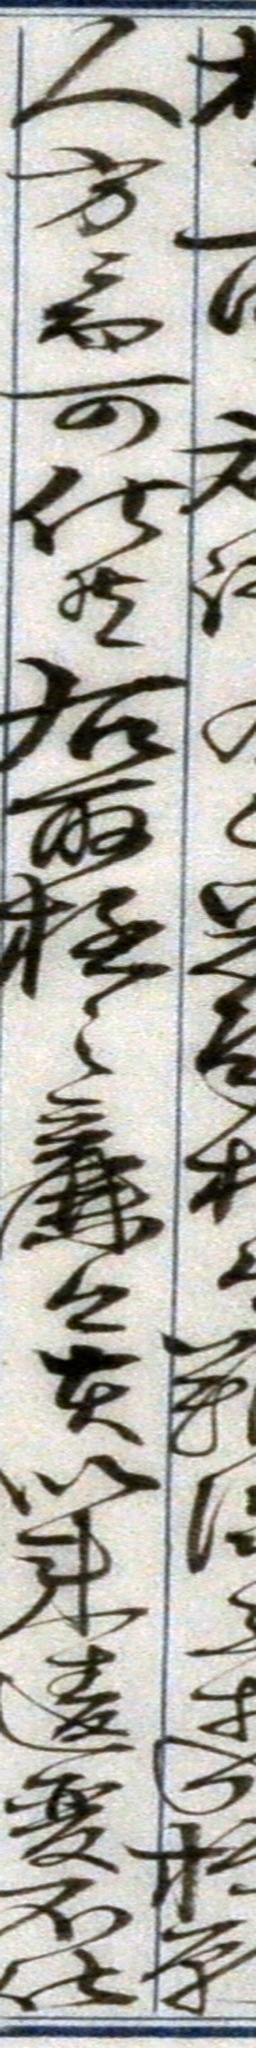人方ニ而可仕候右取極之廉々者以来違変不仕
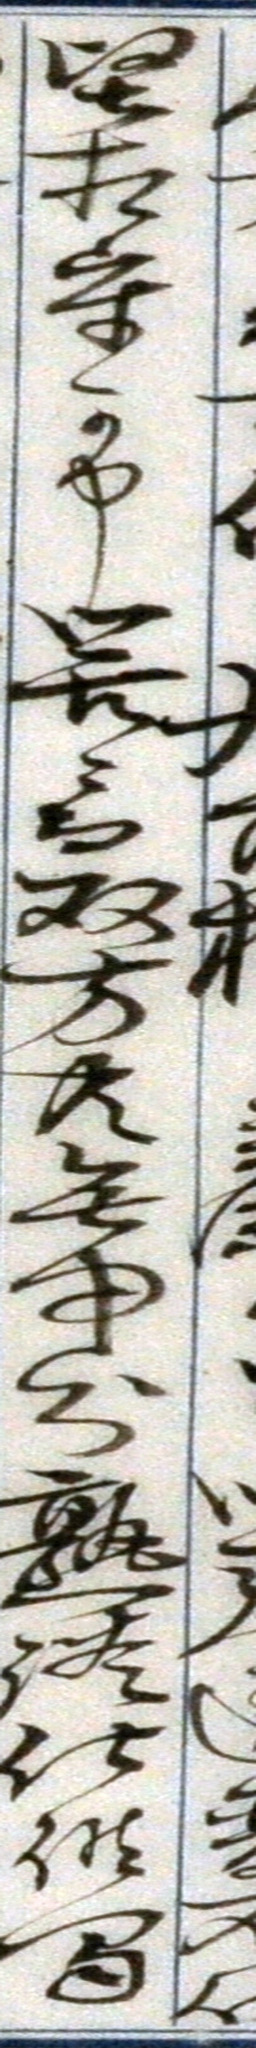皆相守可申筈ニ而双方共其申分熟読仕候間
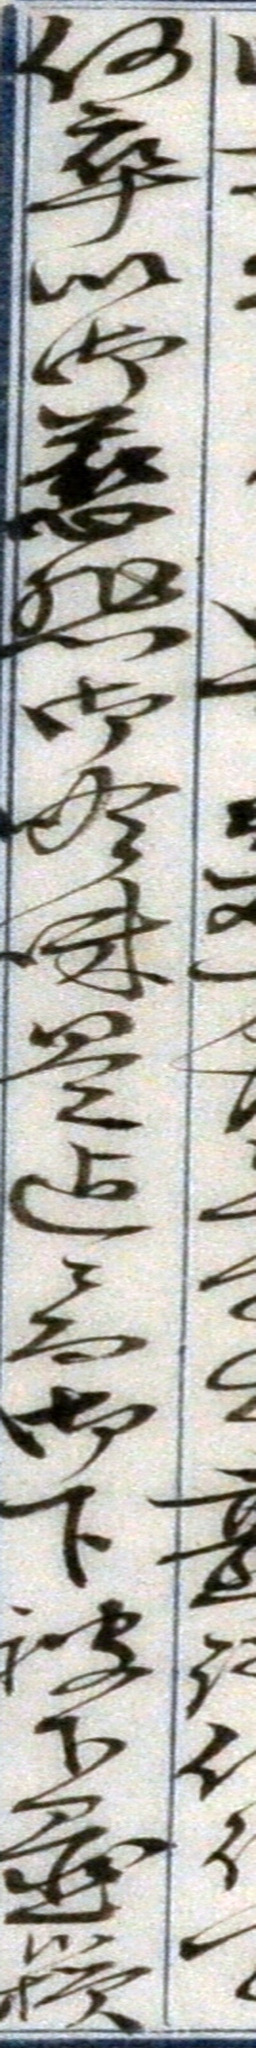何卒以御慈悲御吟味是迄ニ而御下被下置候様
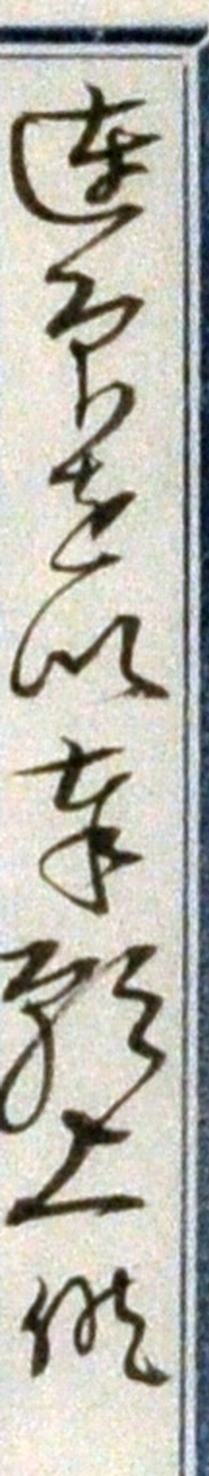連印を以奉願上候
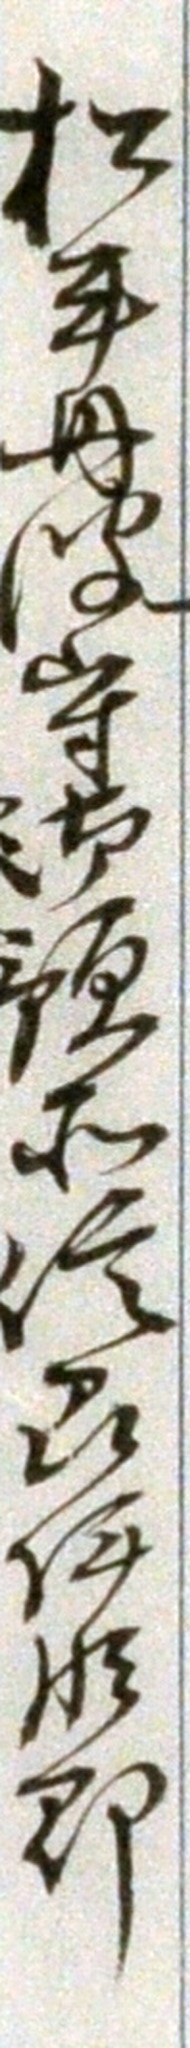松平丹波守御領所信州伊奈郡
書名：天竜川通船難渋願并取極書
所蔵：伊那市立高遠町図書館・合同会社AMANE
